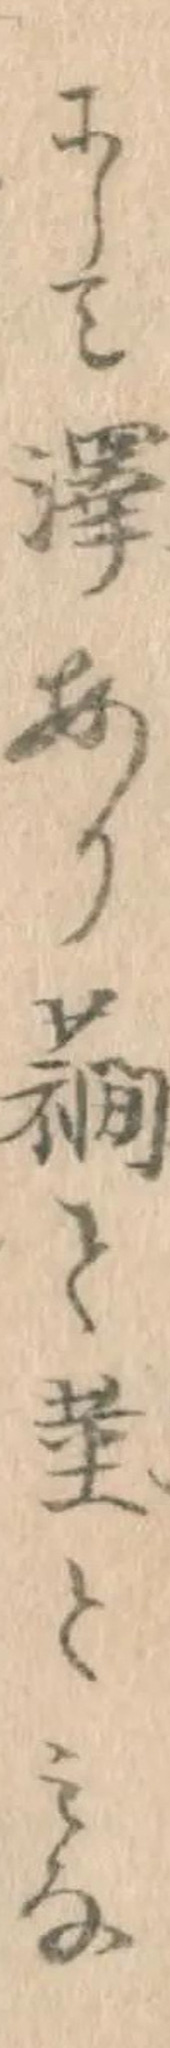にして沢ありと茎とみな
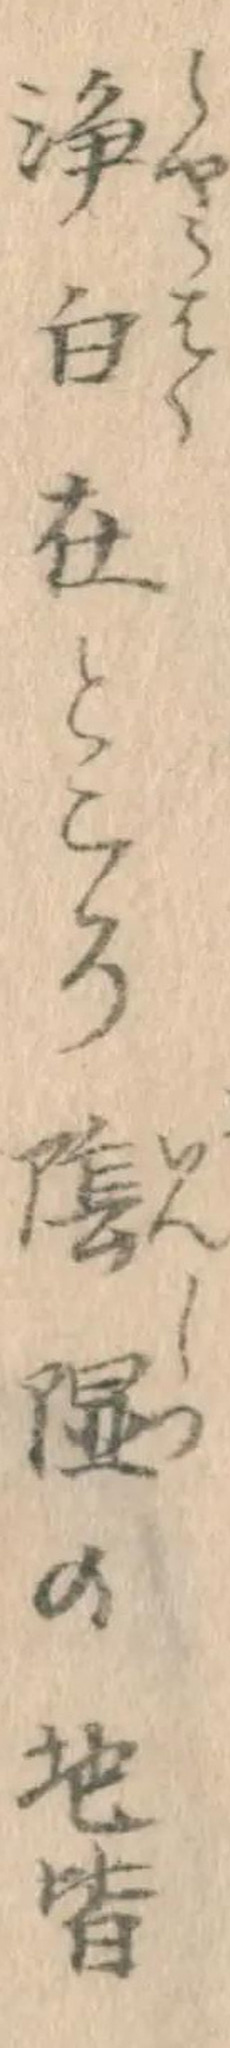浄白在ところ陰湿の地皆
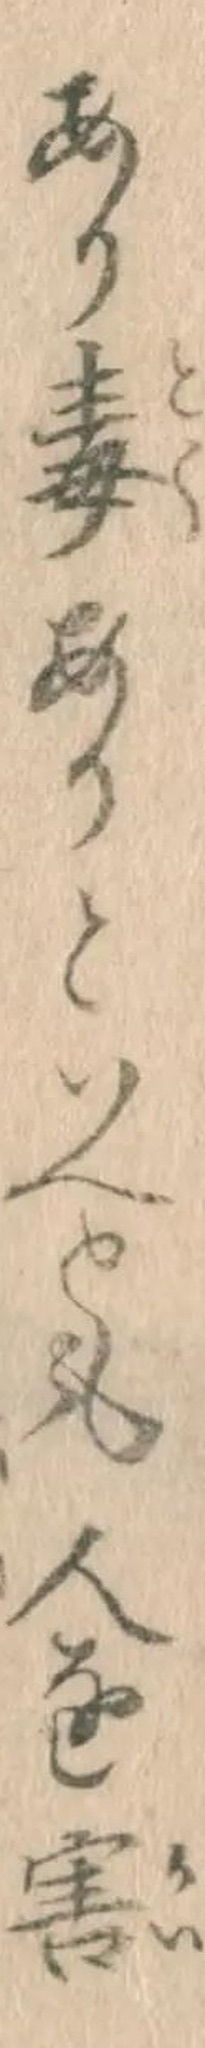あり毒ありといへとも人を害
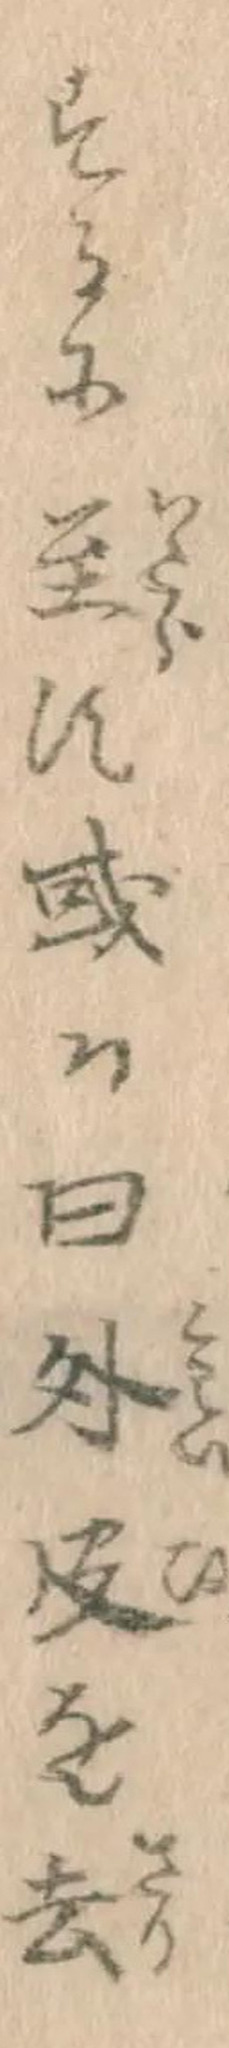するに至す或は曰外皮を去
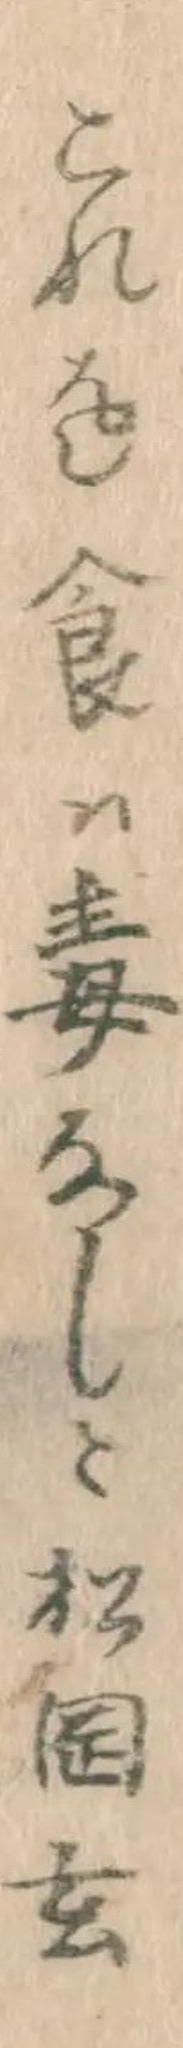これを食は毒なしと松岡玄
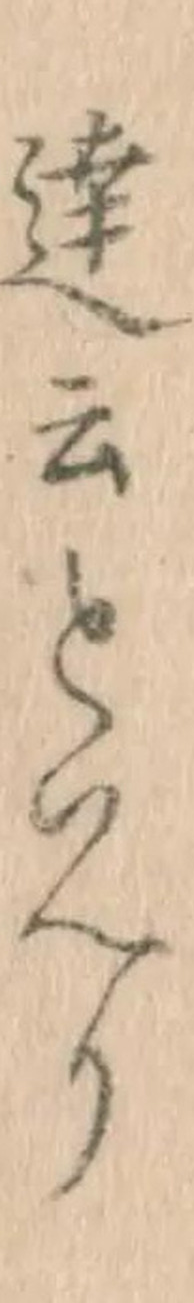達云といへり
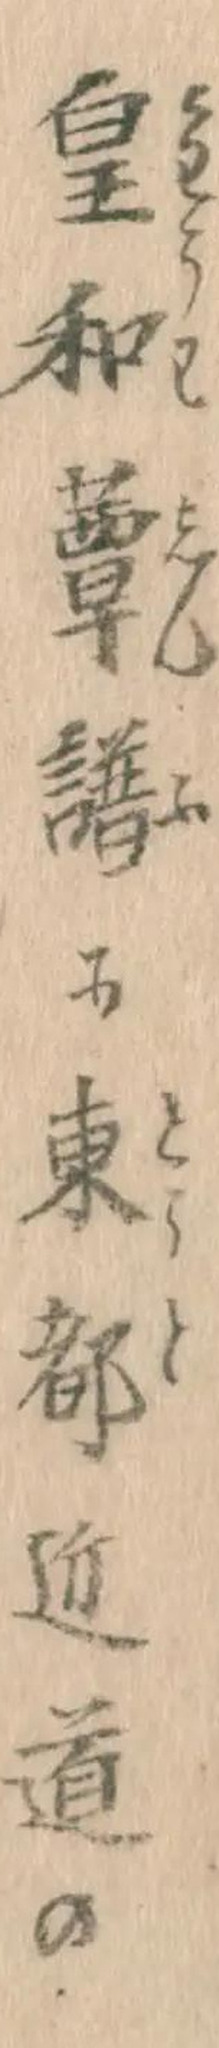皇和蕈譜に東都近道の
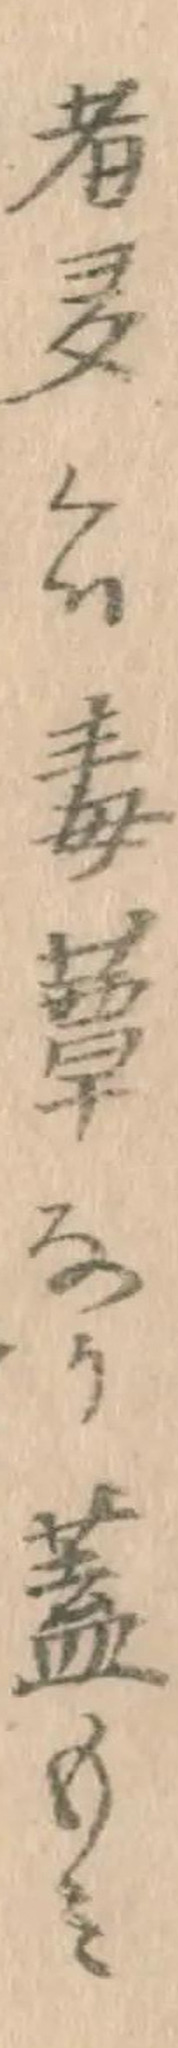者多くは毒蕈なり蓋もみ
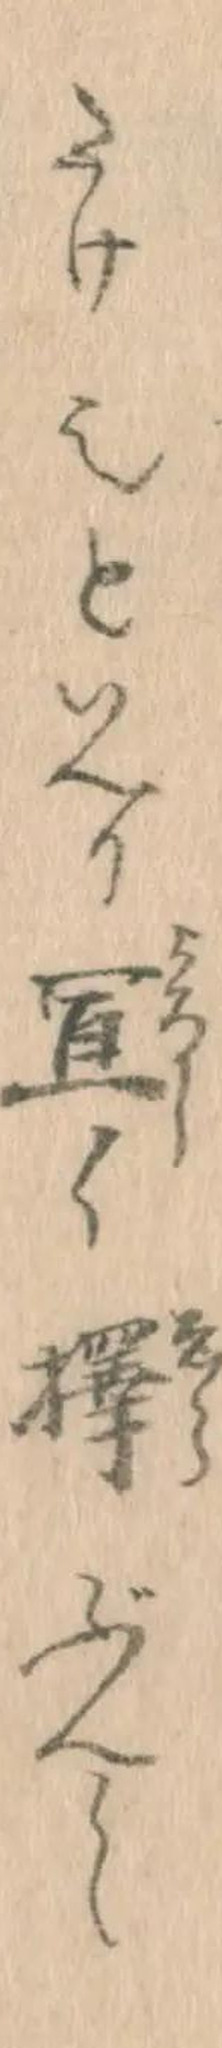たけ也といへり宜く択ぶへし
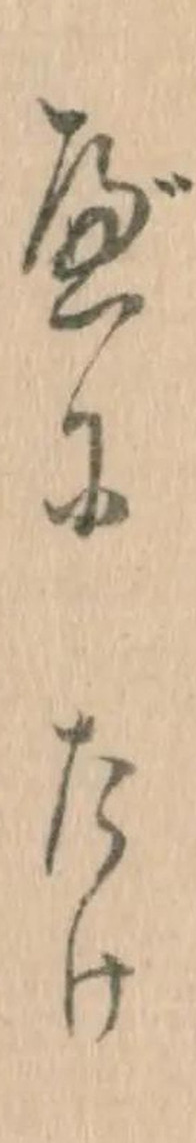べにたけ
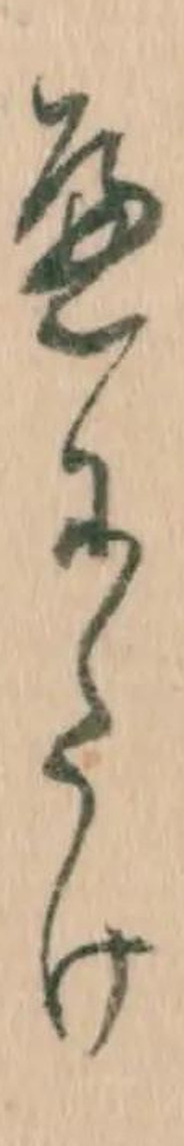へにたけ
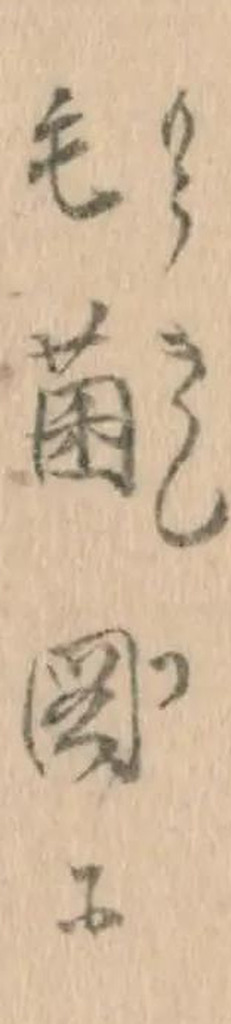毛菌図に
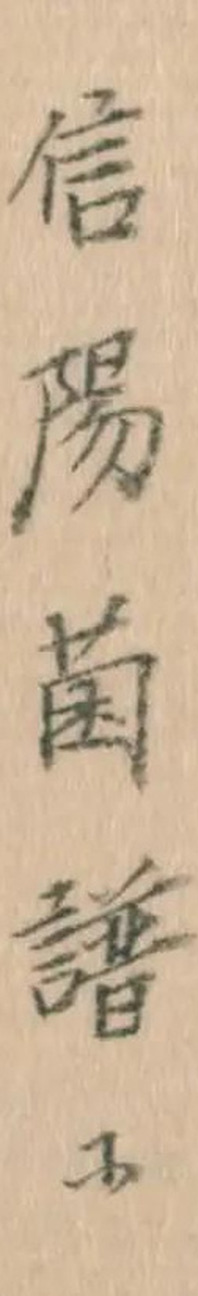信陽菌譜に
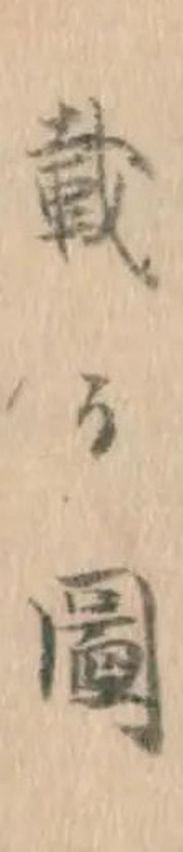載る図
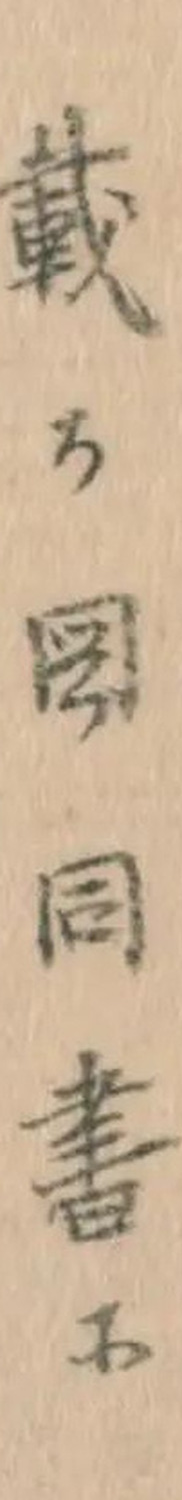載る図同書に
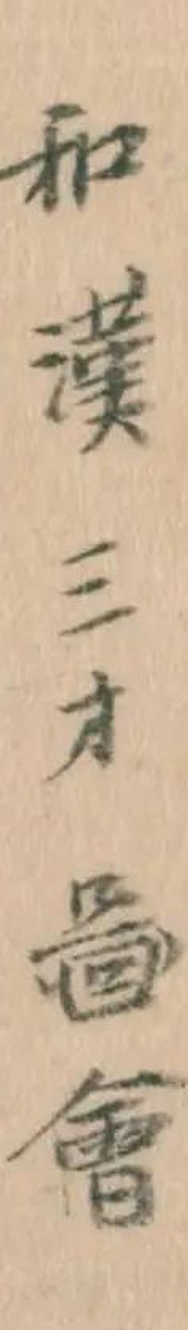和漢三才図会
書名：本草図譜. 巻58-60
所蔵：国立国会図書館 National Diet Library, JAPAN
